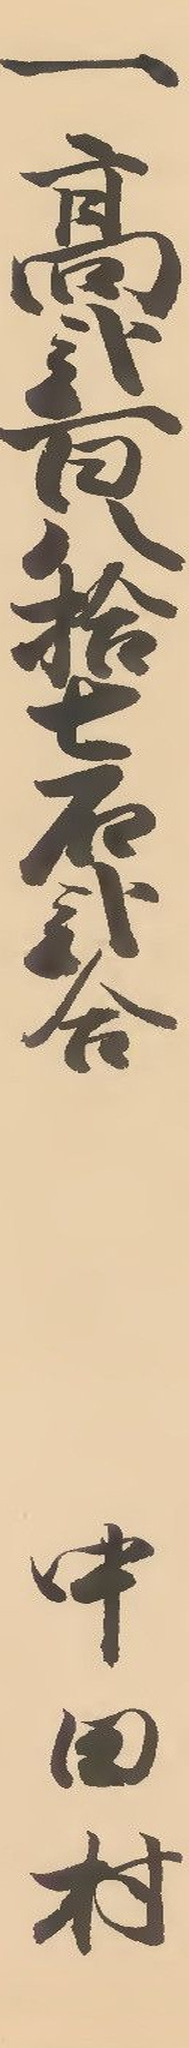一高弐百八拾七石弐合中田村
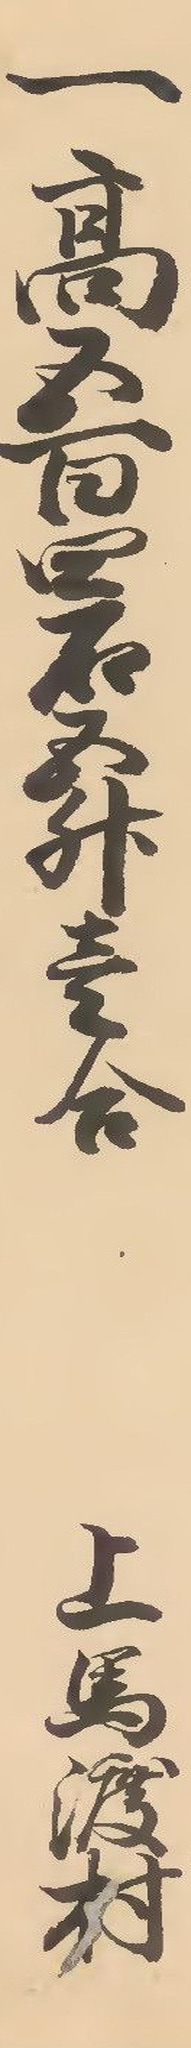一高五百四石五升壱合上馬渡村

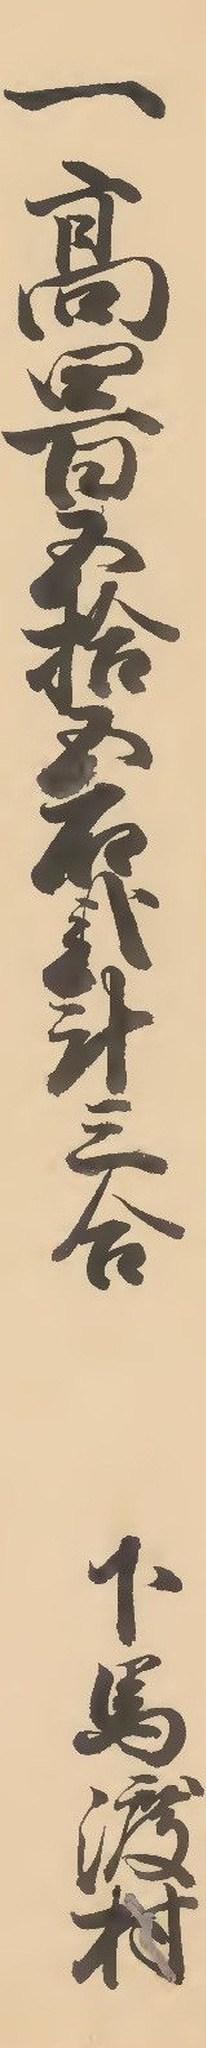一高四百五拾五石弐斗三合下馬渡村
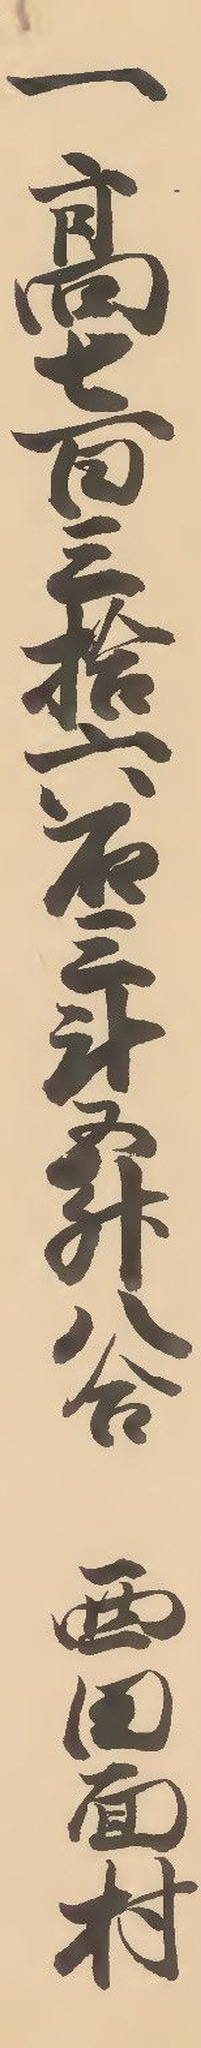一高七百三拾六石三斗五升八合西田面村
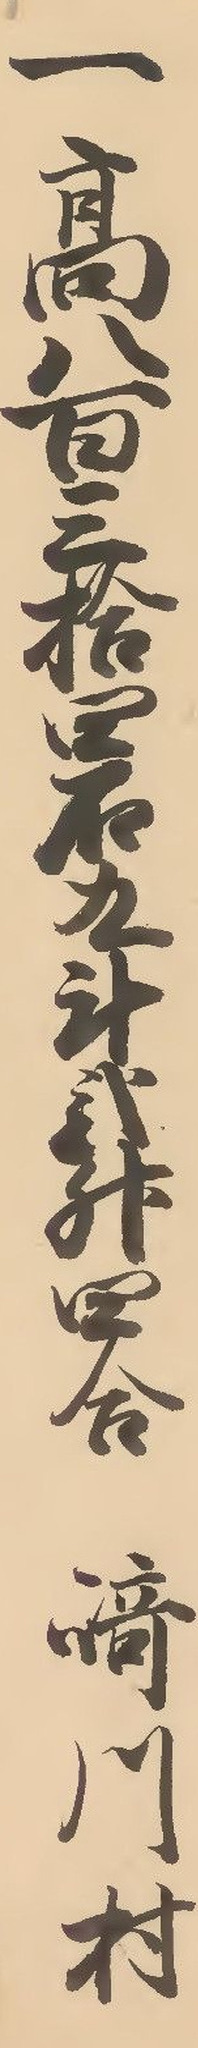一高八百三拾四石九斗弐升四合崎川村
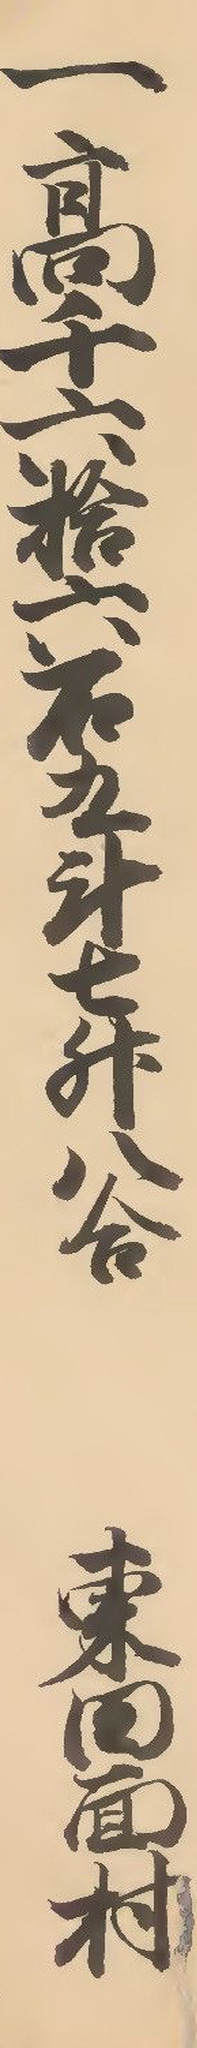一高千六拾六石九斗七升八合東田面村
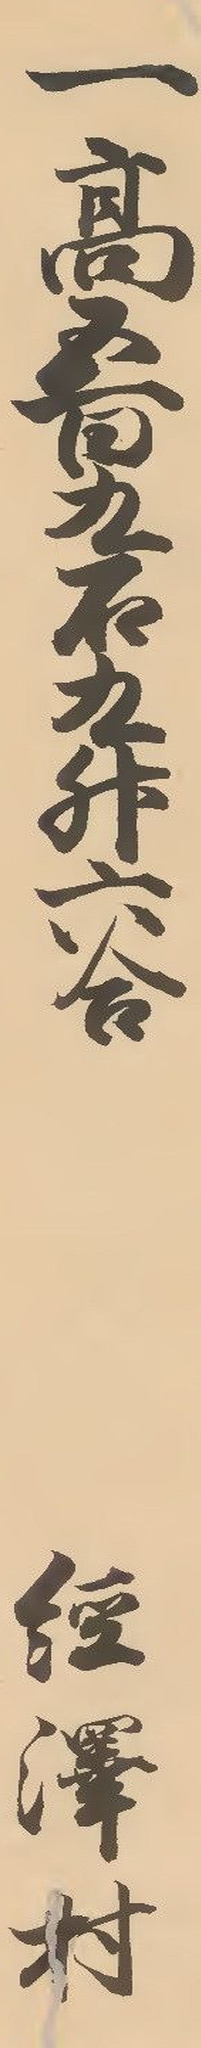一高五百九石九升六合経沢村
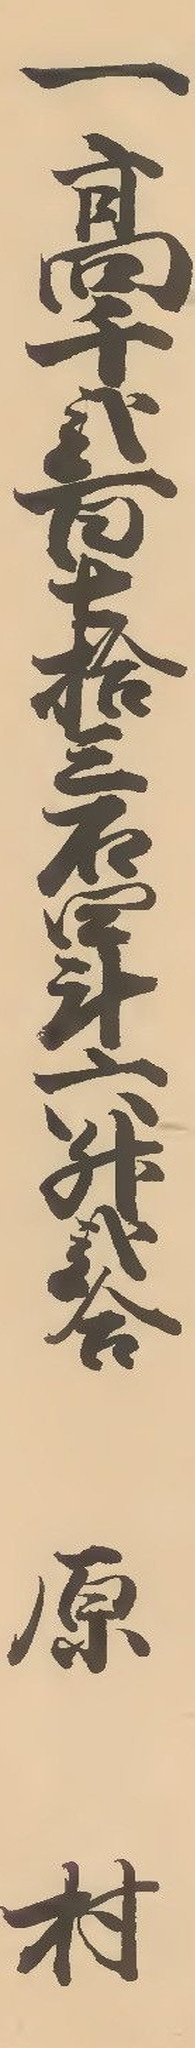一高千弐百七拾三石四斗六升弐合原村
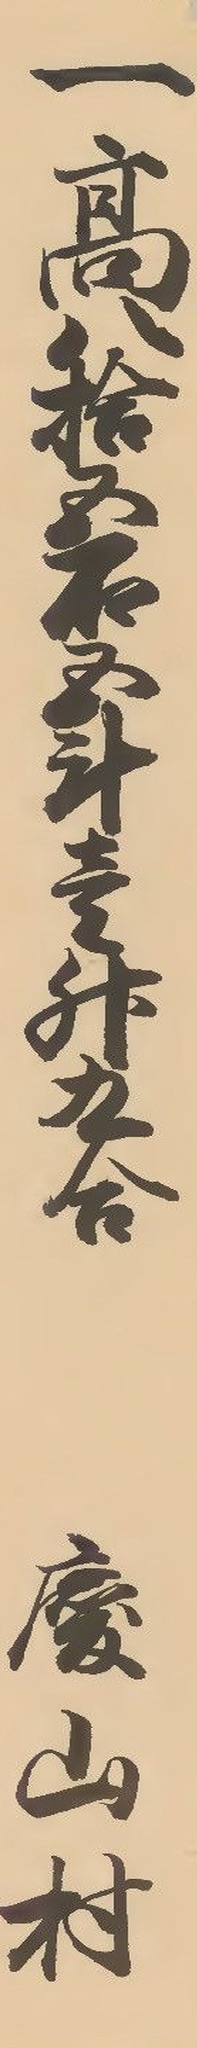一高八拾五石五斗壱升九合慶山村
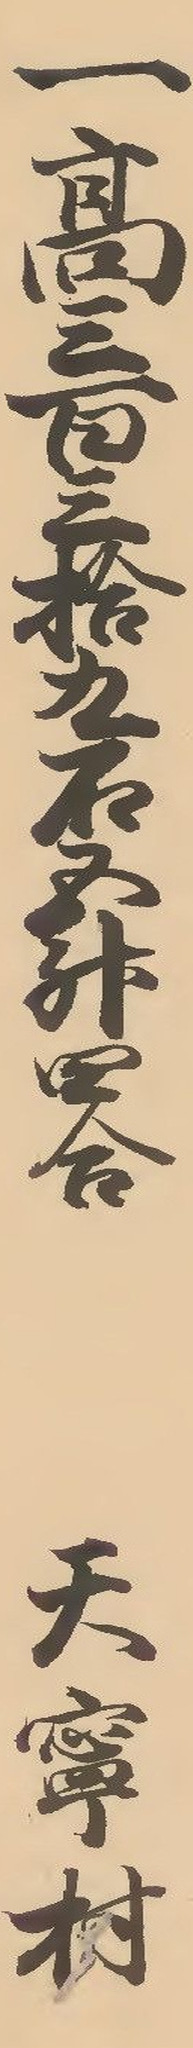一高三百三拾九石五升四合天寧村

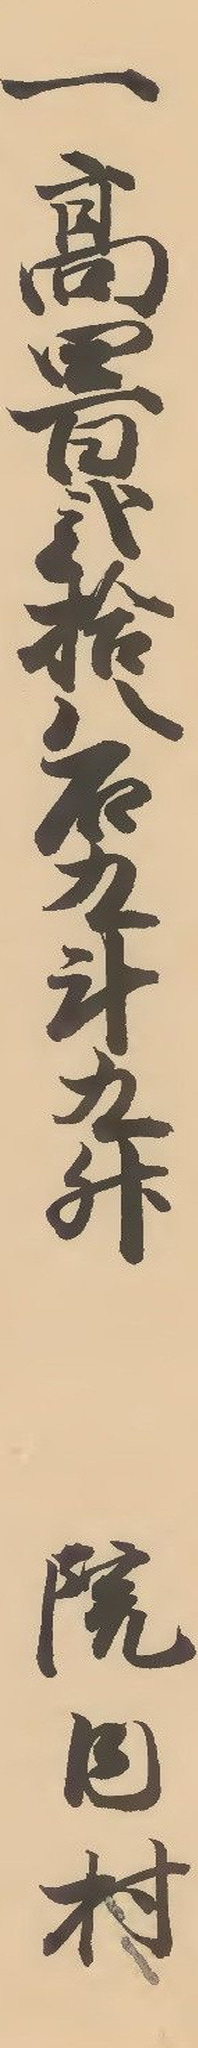一高四百弐拾八石九斗九升院内村
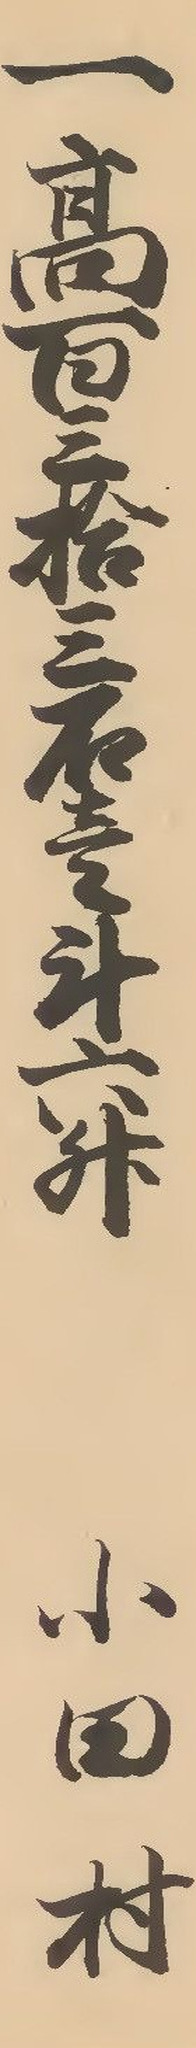一高百三拾三石壱斗六升小田村
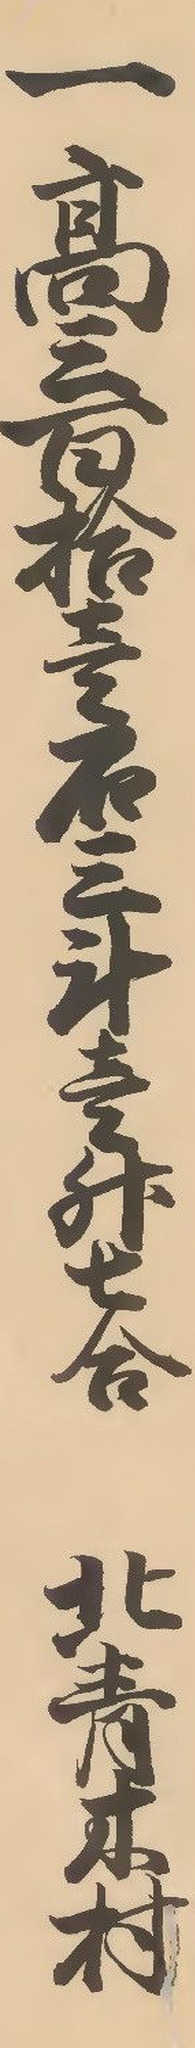一高三百拾壱石三斗壱升七合北青木村
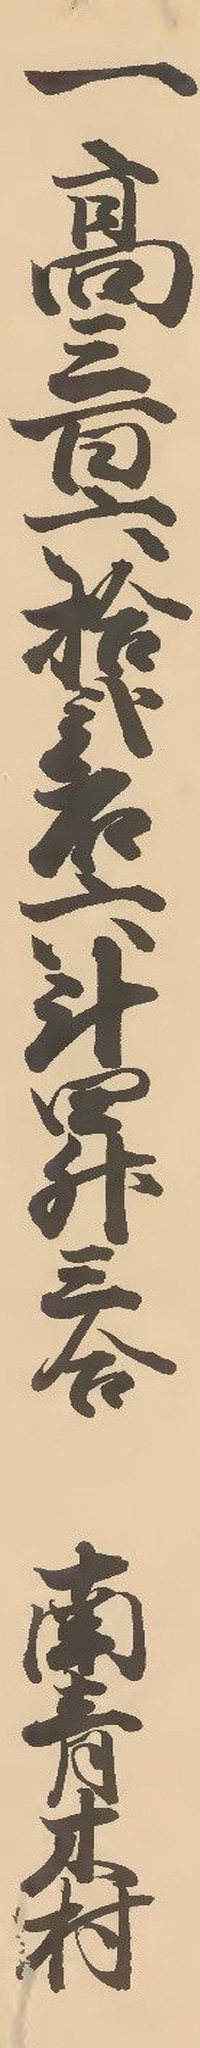一高三百六拾弐石六斗四升三合南青木村
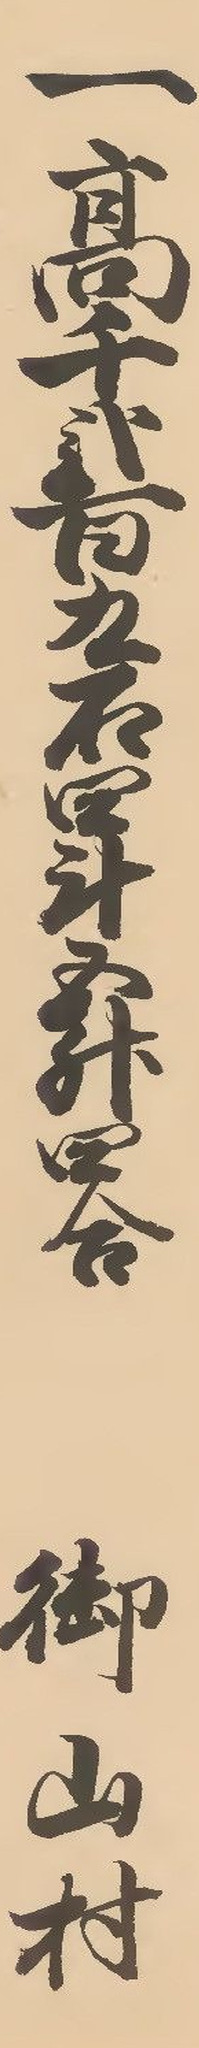一高千弐百九石四斗五升四合御山村
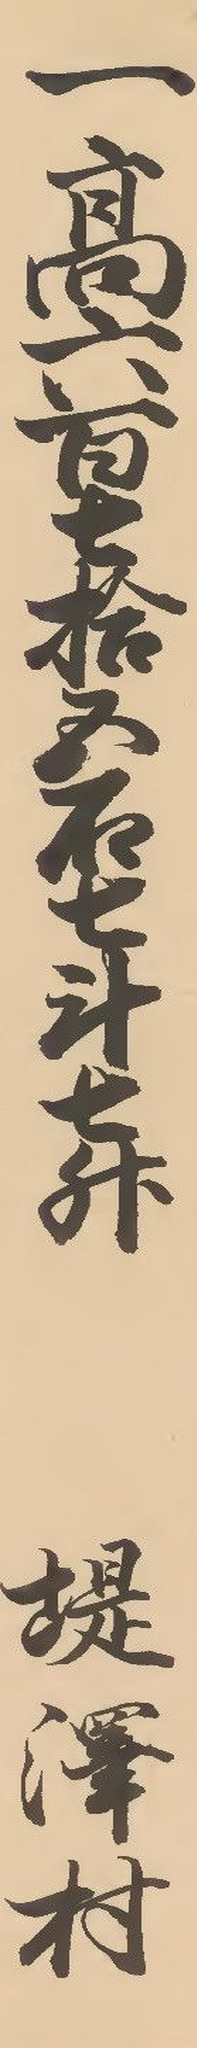一高六百七拾五石七斗七升提沢村
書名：陸奥国郷帳　１
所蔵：国立公文書館 National Archives of Japan
